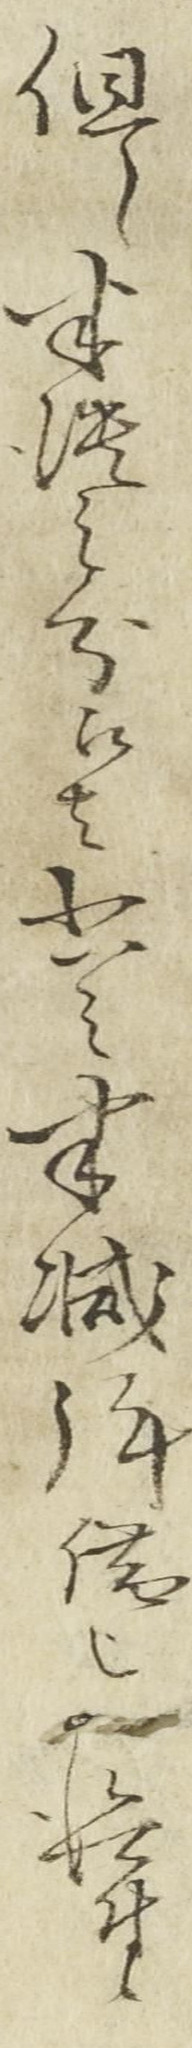但し半潰之分江者右之半減拝借被仰付候
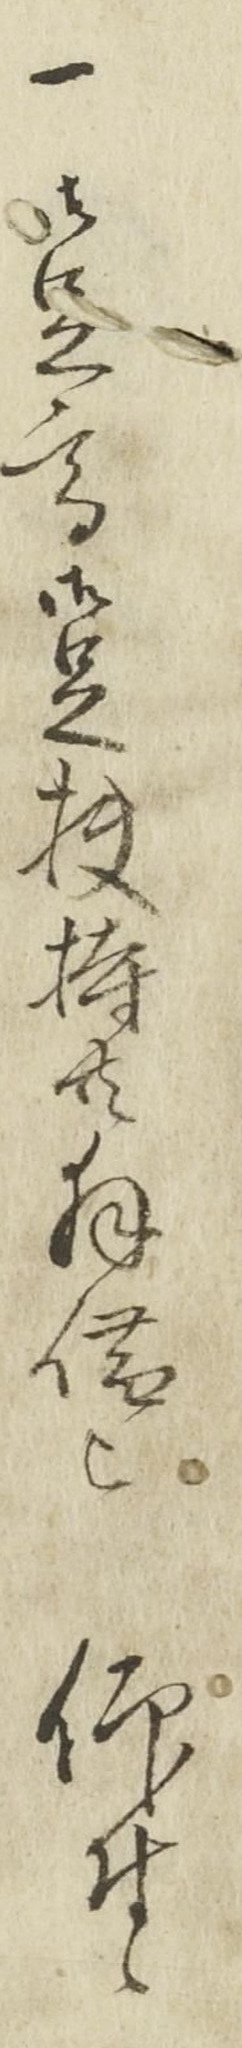一御足高御足扶持共拝借被仰付候
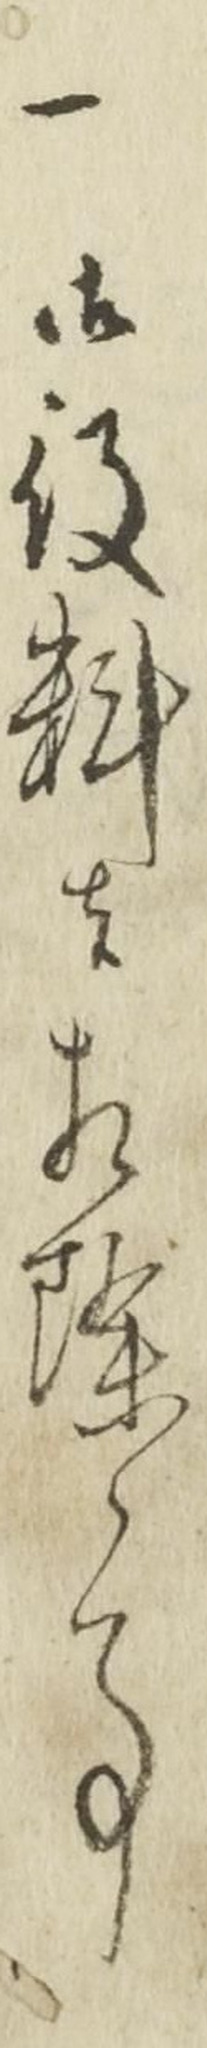一御役料者相除候事
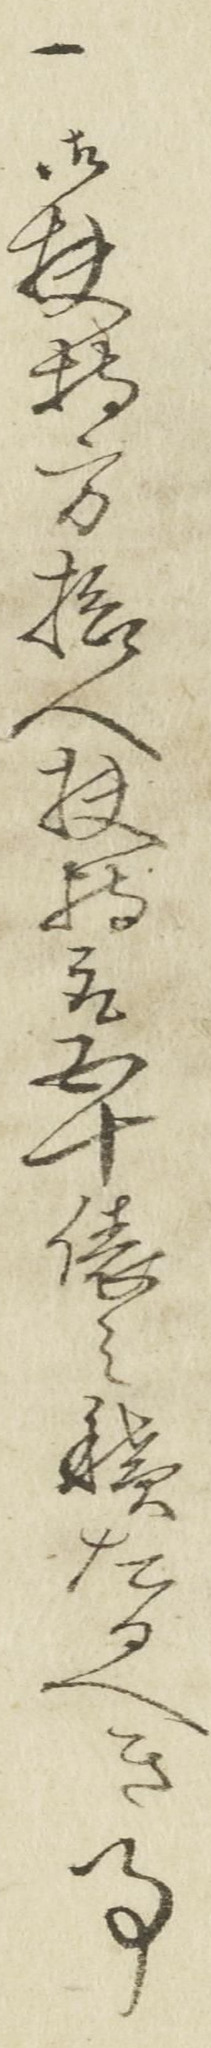一御扶持方拾人扶持取五十俵之積たるへき事
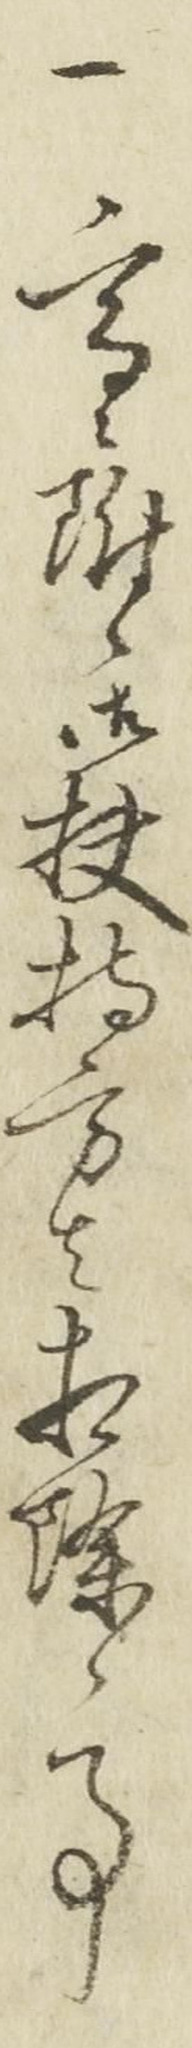一高ニ附候御扶持方者相除候事
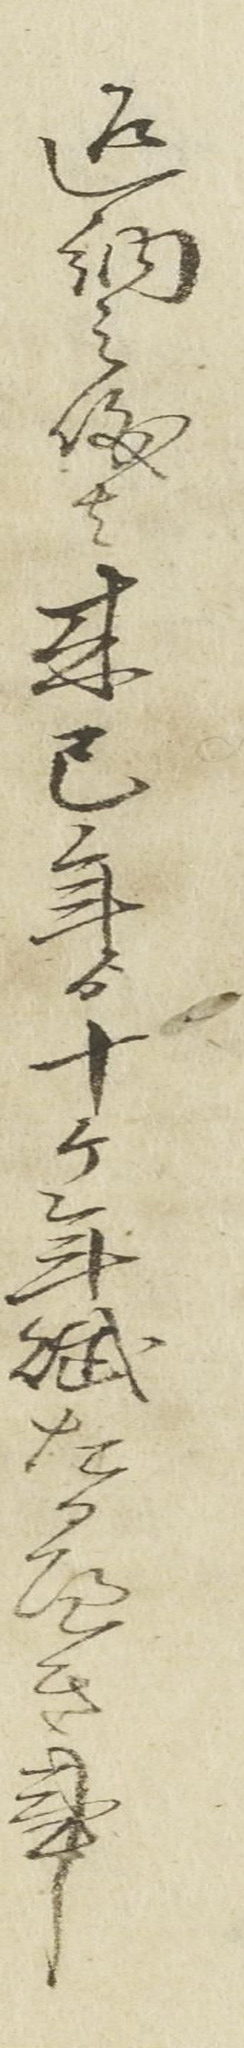一返納之儀者来巳年ゟ十ケ年賦たるへき事
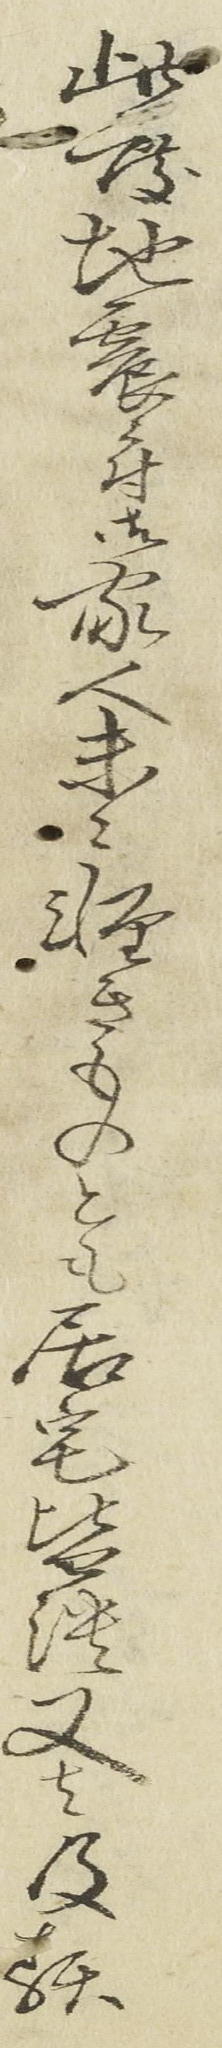此度地震ニ付御家人末々軽きものとも居宅皆潰又者及類
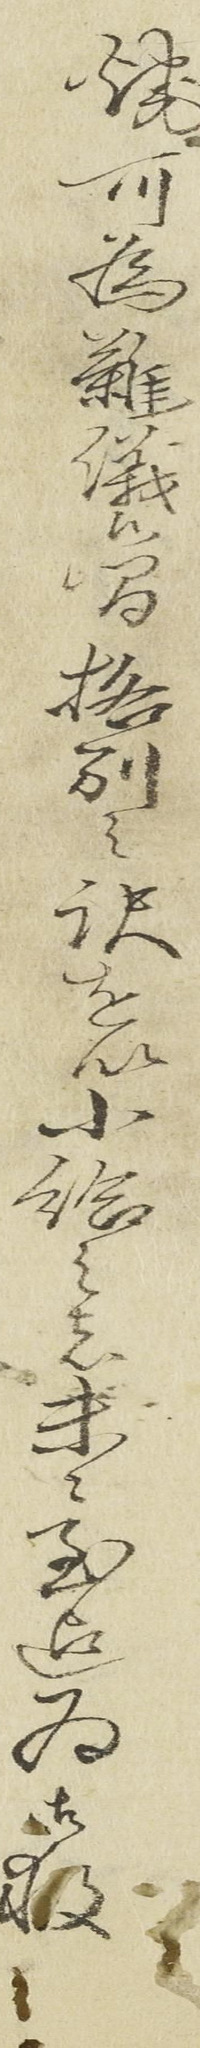焼可為難儀候間格別之訳を以小給之者末々ニ至迄為御救
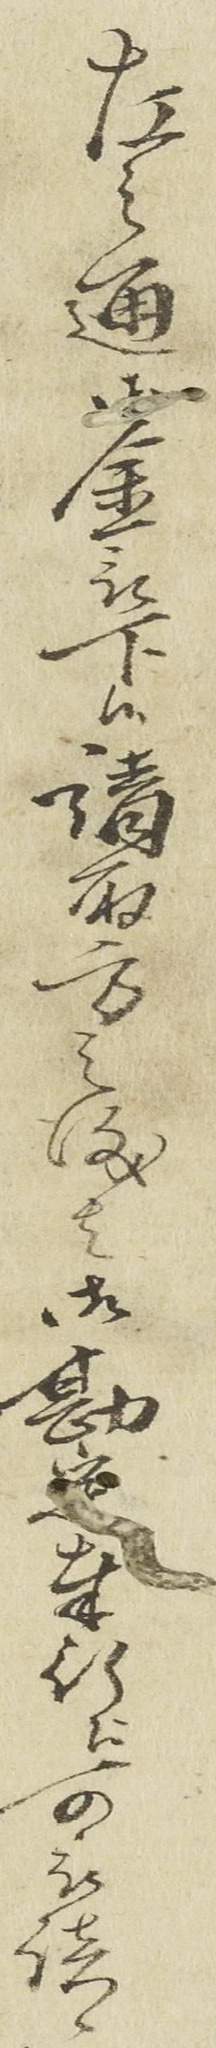左之通御金被下候請取方之儀者御勘定奉行江可被談候
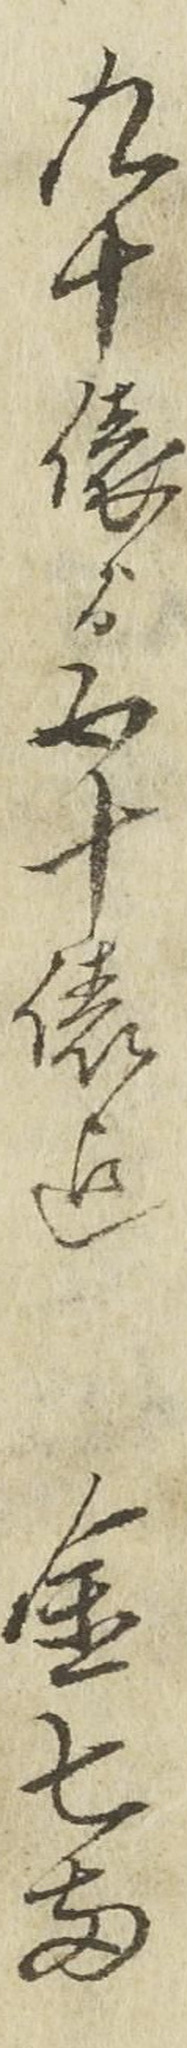九十俵ゟ五十俵迄金七両
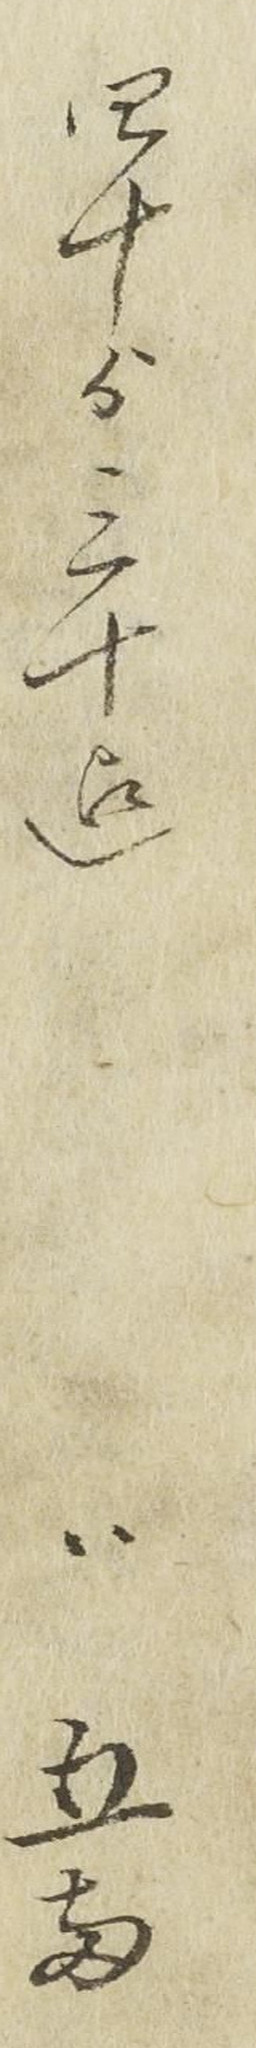四十ゟ三十迄同五両
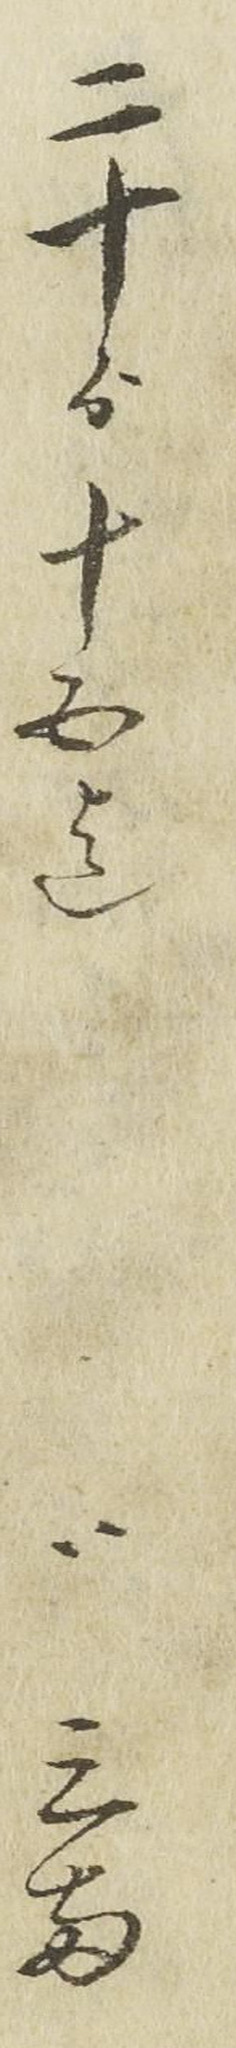二十ゟ十五迄同三両
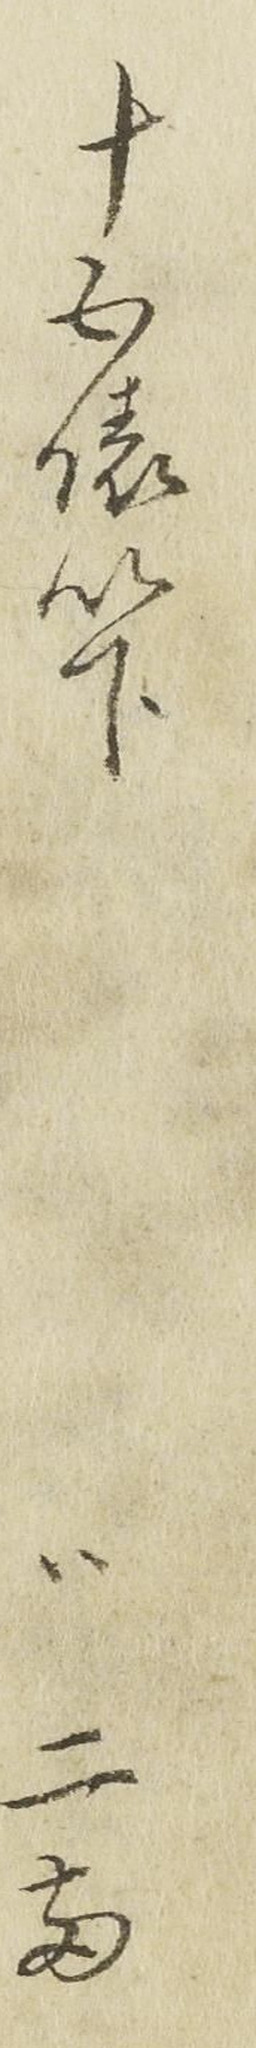十五俵以下同二両
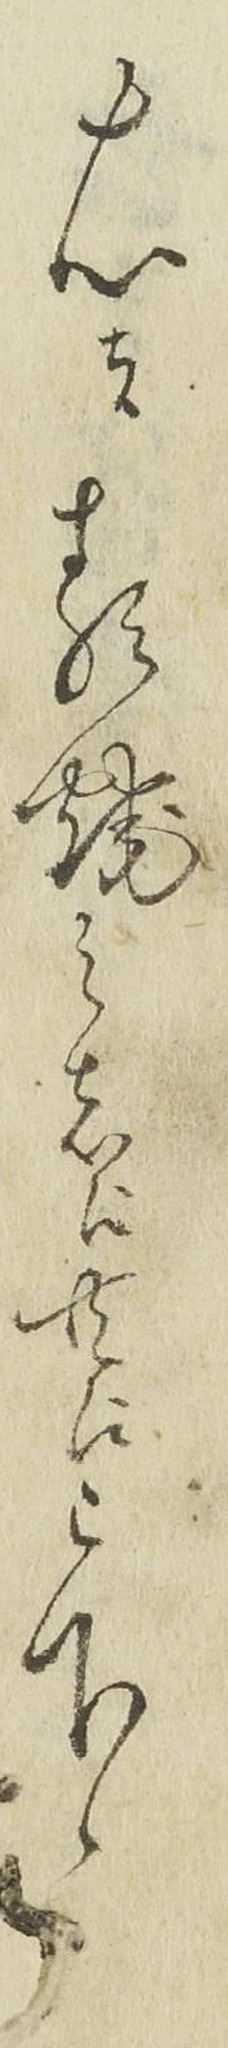右者類焼之者江共江被下候
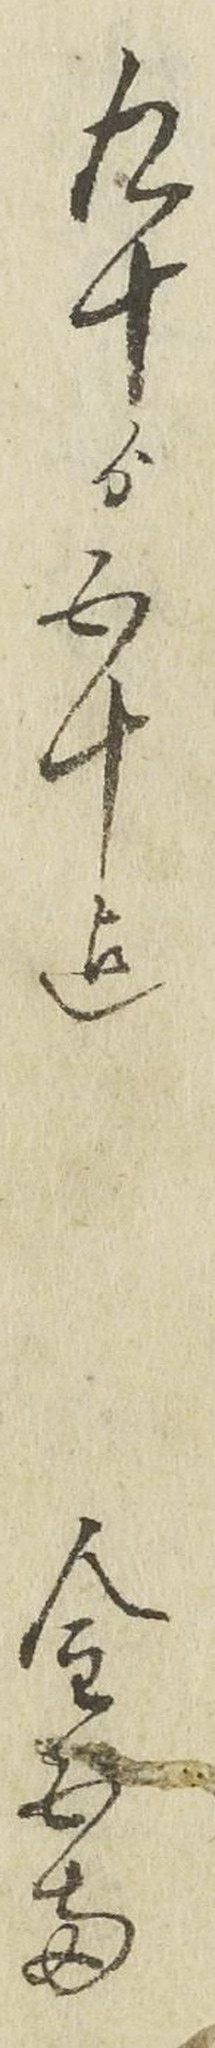九十ゟ五十迄金五両
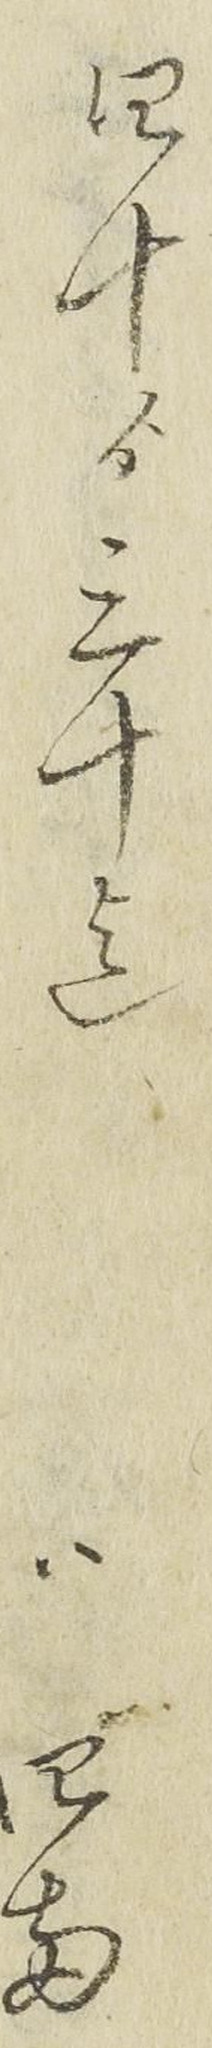四十ゟ三十迄同四両
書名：安政二乙卯年十月二日大地震之事
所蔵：東京大学地震研究所図書室 Earthquake Research Institute Library, The University of Tokyo, JAPAN
